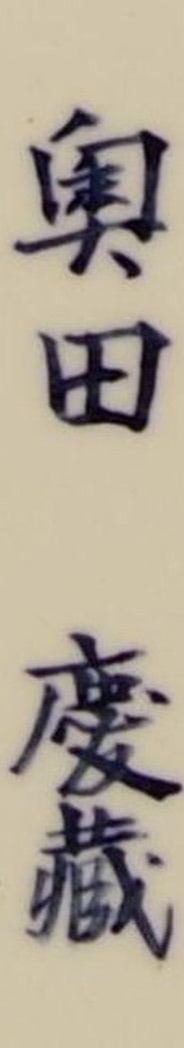奥田慶蔵
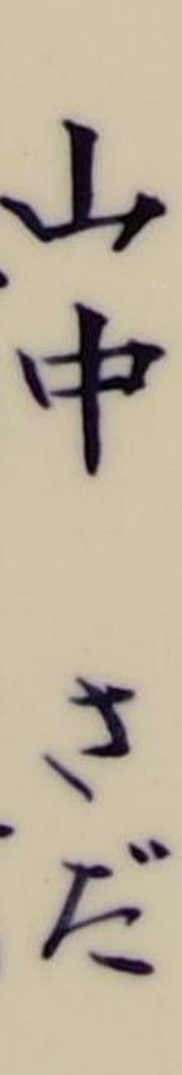山中さだ
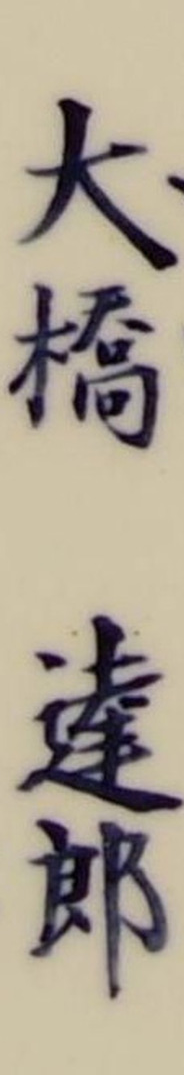大橋達郎
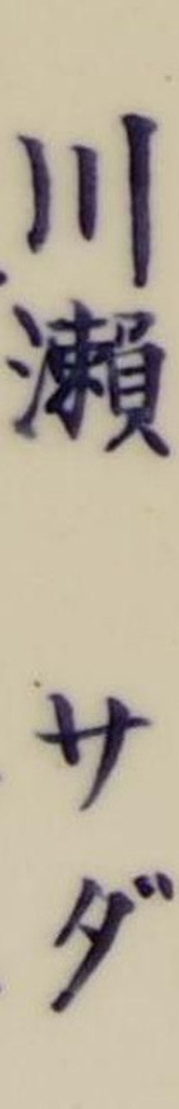川瀬サダ
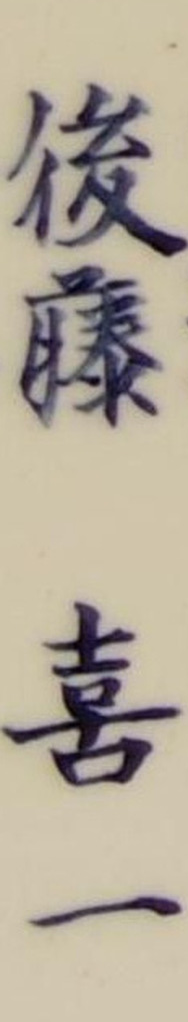後藤喜一
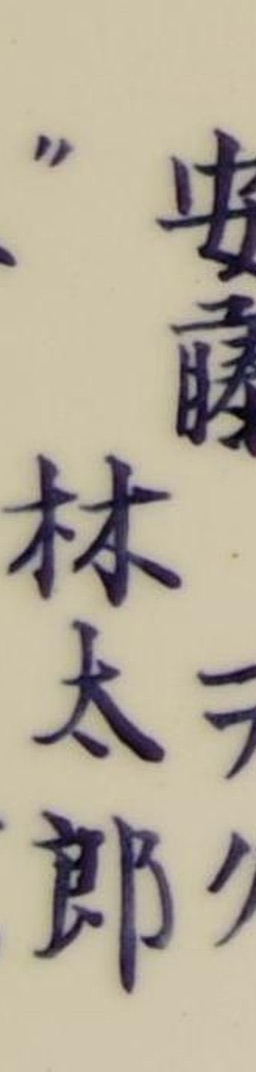林太郎
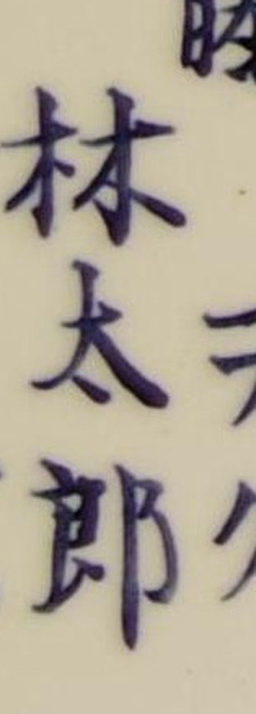林太郎
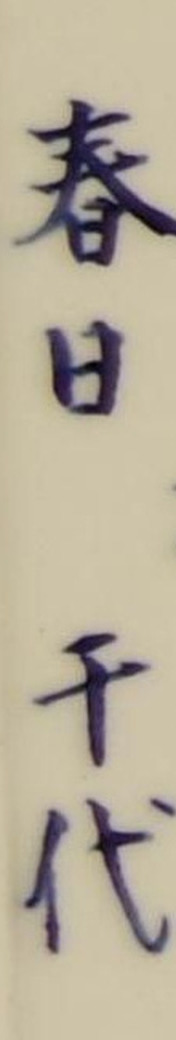春日千代

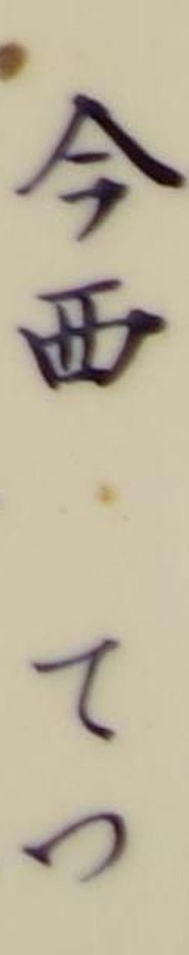今西てつ
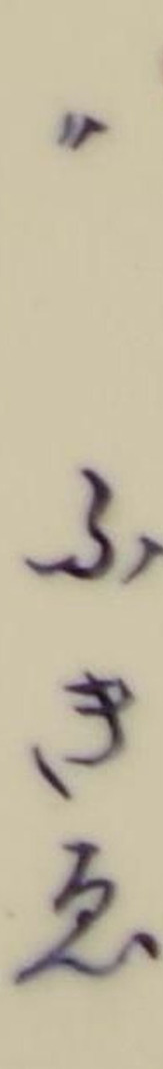ふきゑ
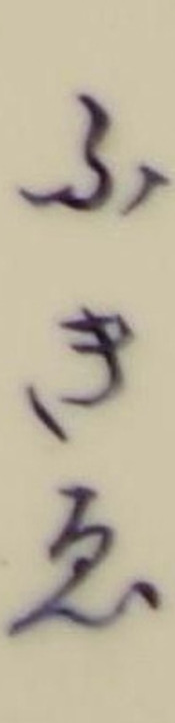ふきゑ
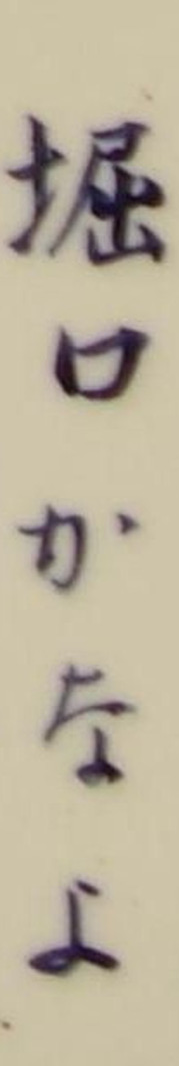堀口かなよ
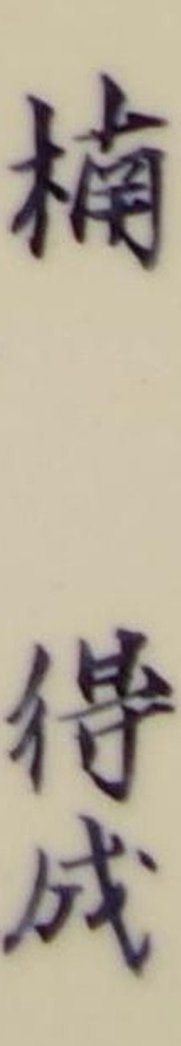楠得成
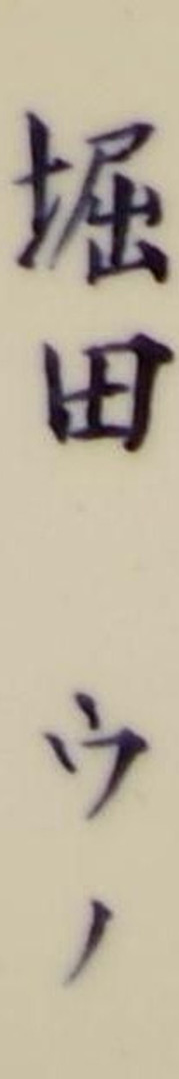堀田ウノ
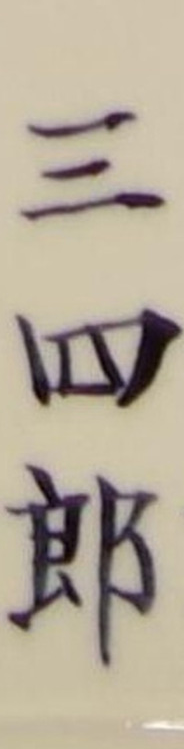三四郎
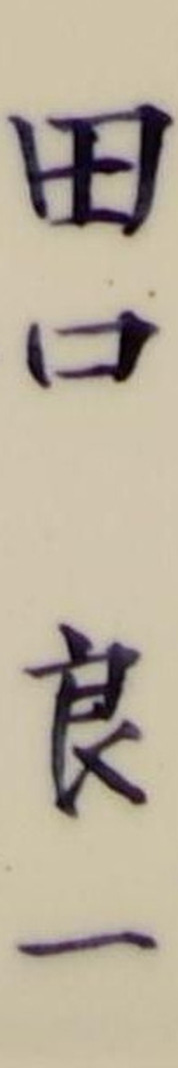田口良一
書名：E~L
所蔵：高野山金剛峯寺
